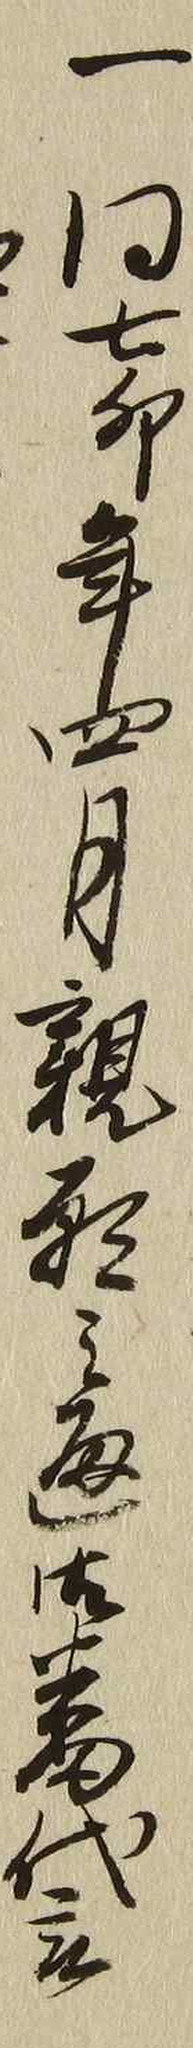一同七卯年四月親願之通御代被
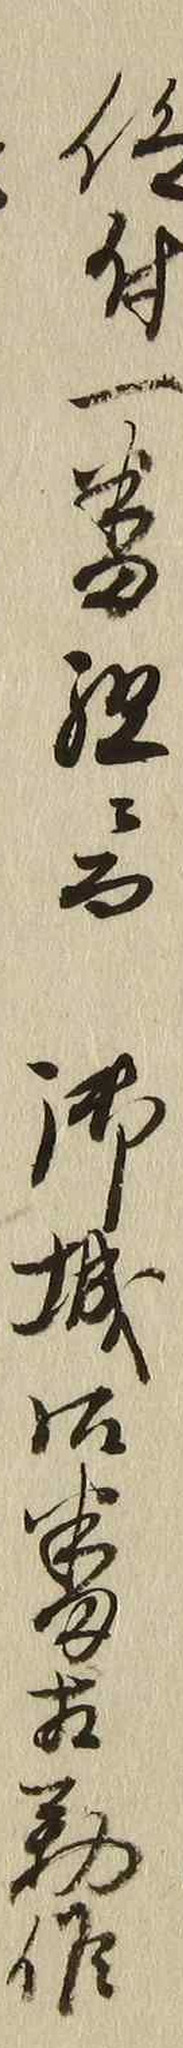仰付一番組ニ而御城御番相勤候
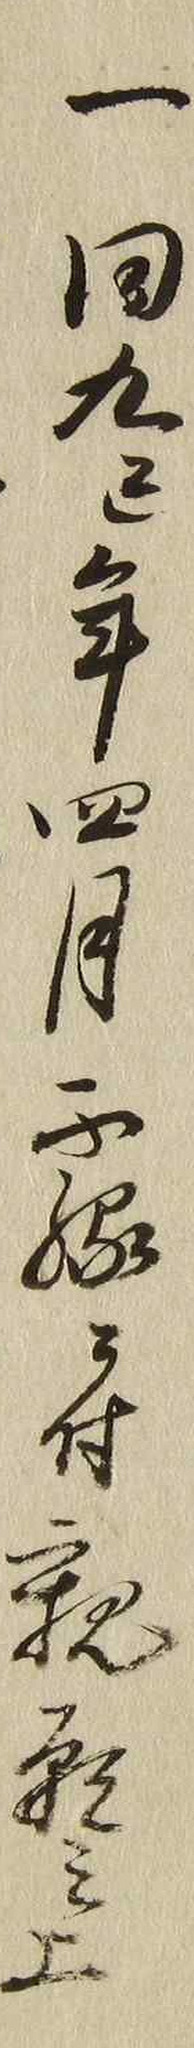一同九巳年四月不縁ニ付親願之上
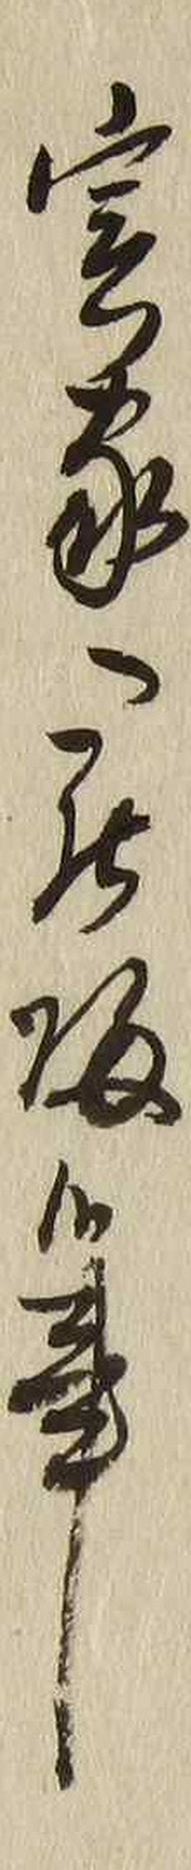実家へ罷帰候事
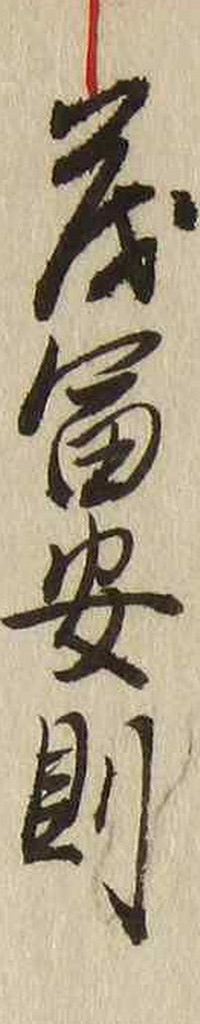茂富安則
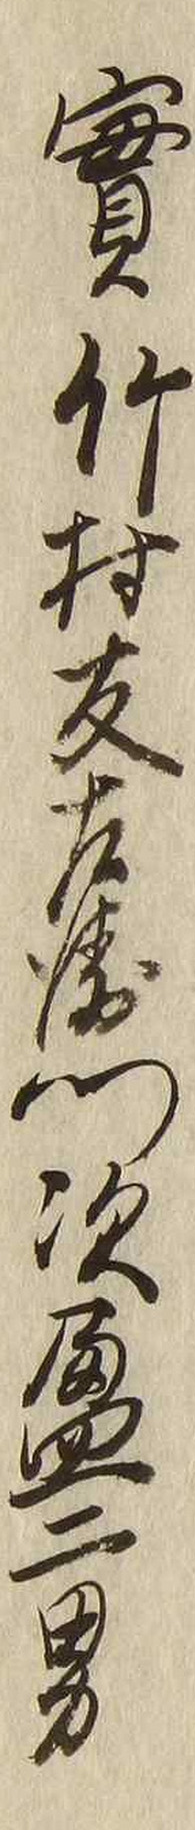実竹村友左衛門次盈二男

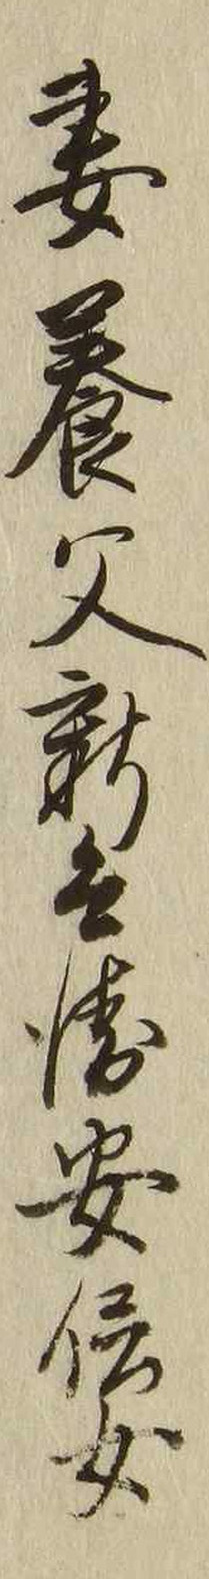妻養父新兵衛安信女
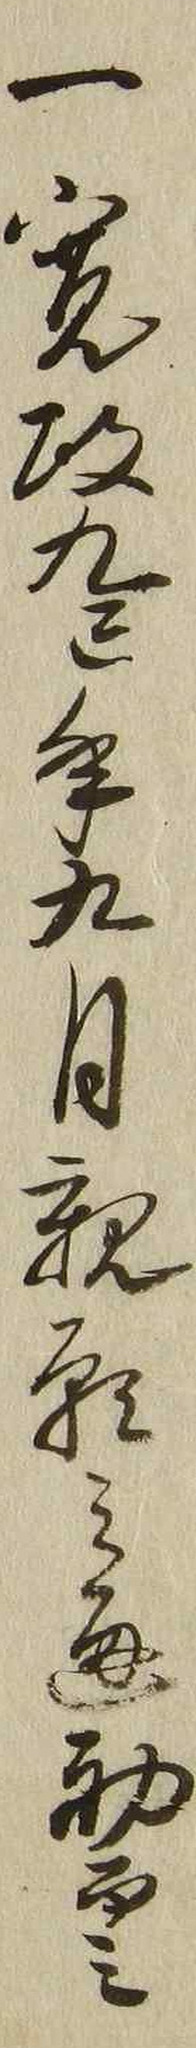一寛政九巳年九月親願之通初而之
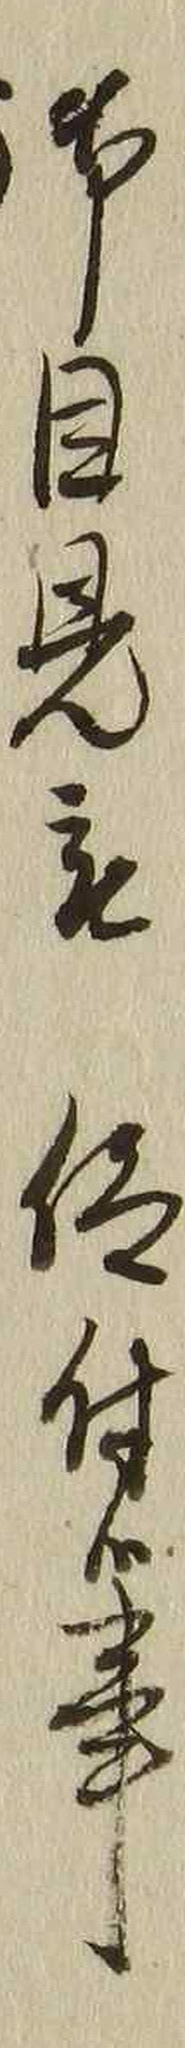御目見被仰付候事
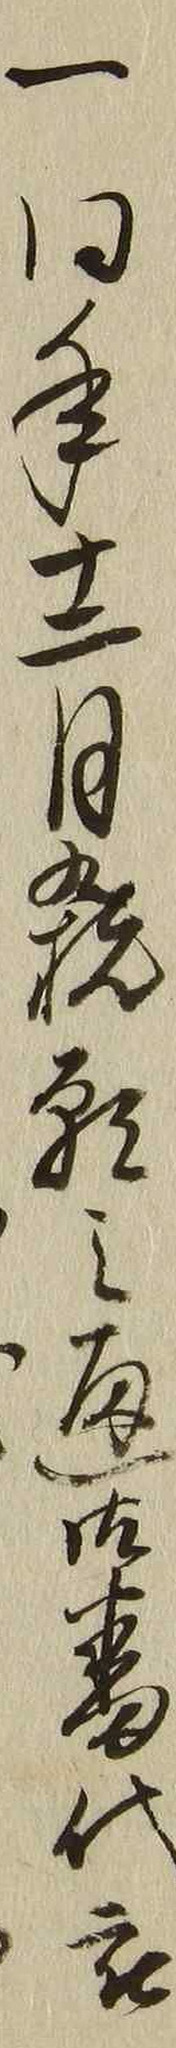一同年十二月親願之通御番代被
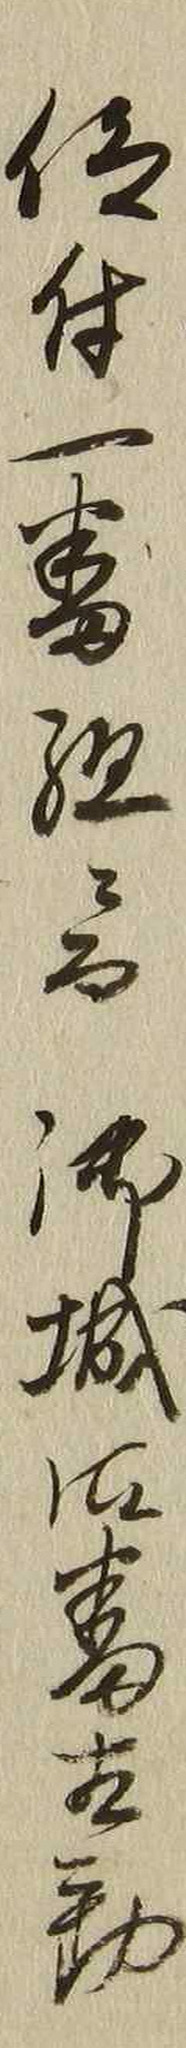仰付一番組ニ而御城御番相勤
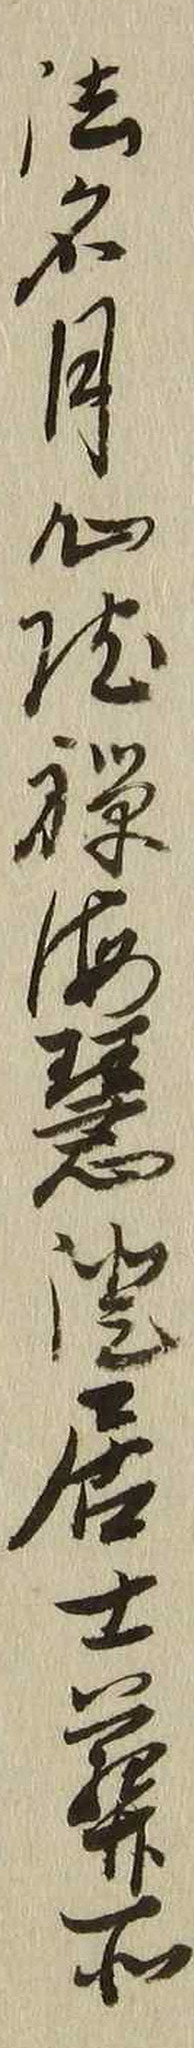法名月心院禅海慧証居士葬所
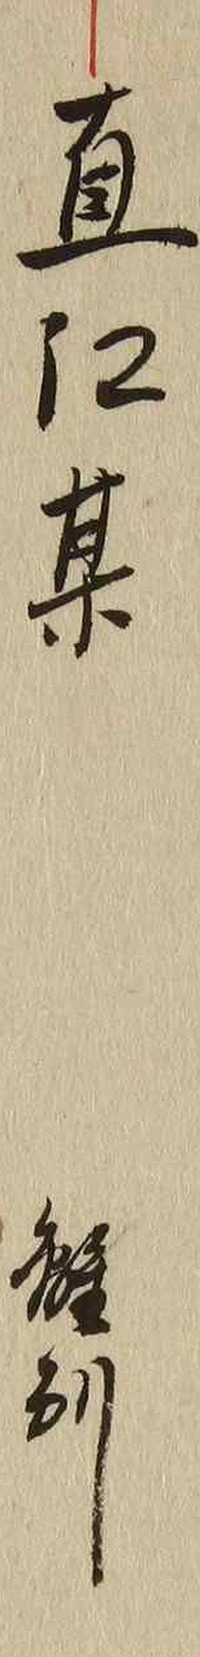直江某離別
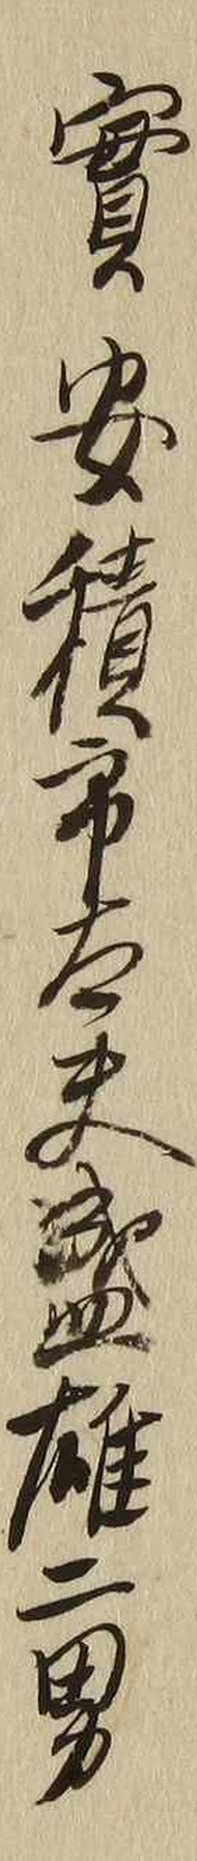実安積市太夫盛雄二男
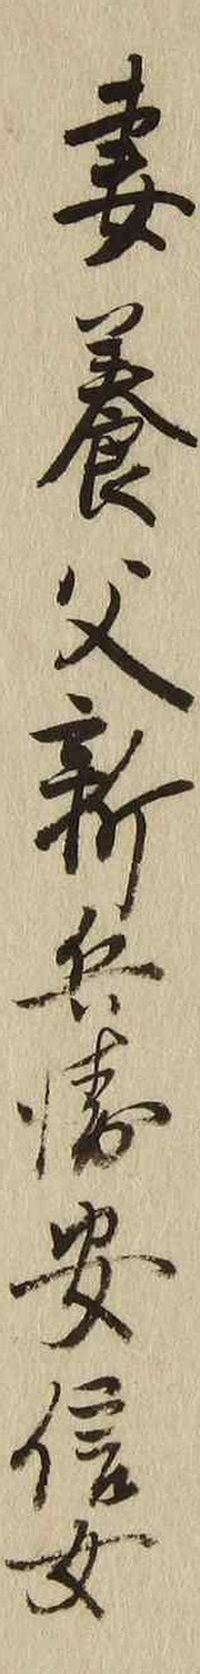妻養父新兵衛安信女
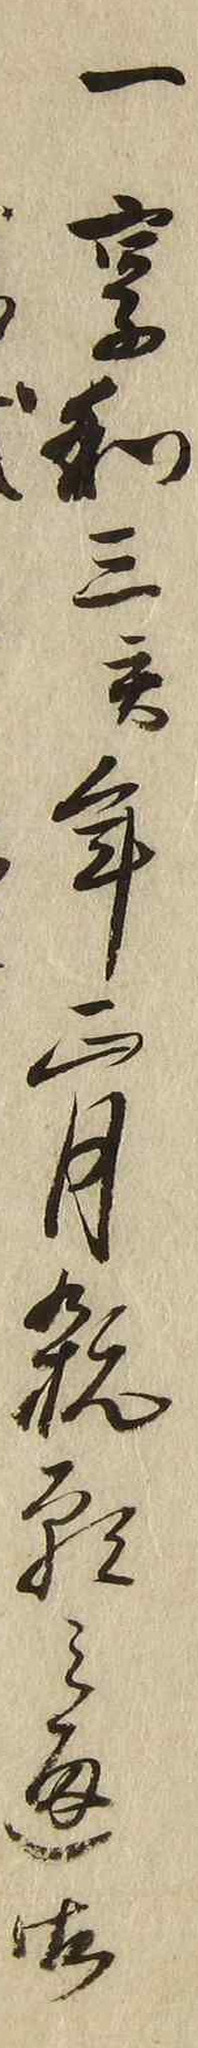一享和三亥年正月親願之通御
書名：諸士系譜　巻之348　も之部4
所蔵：会津若松市立会津図書館
